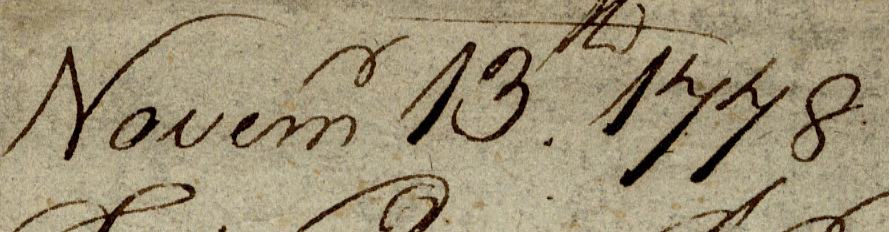Novem^r 13^th. 1778
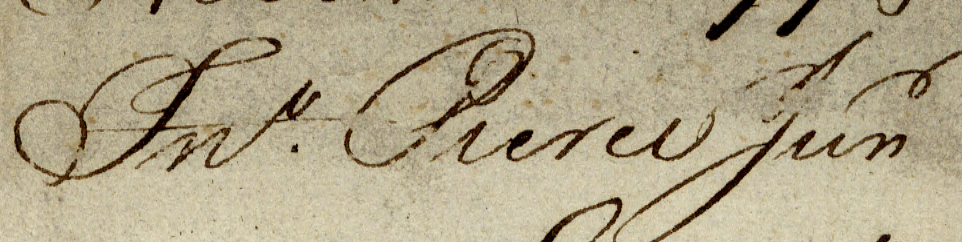Jn^o. Pierce Jun^r
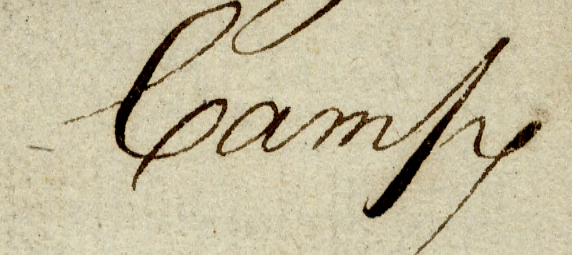Camp
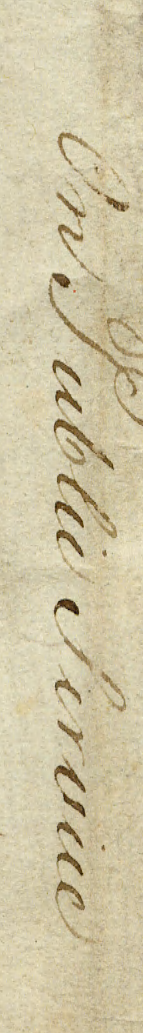On Public Service
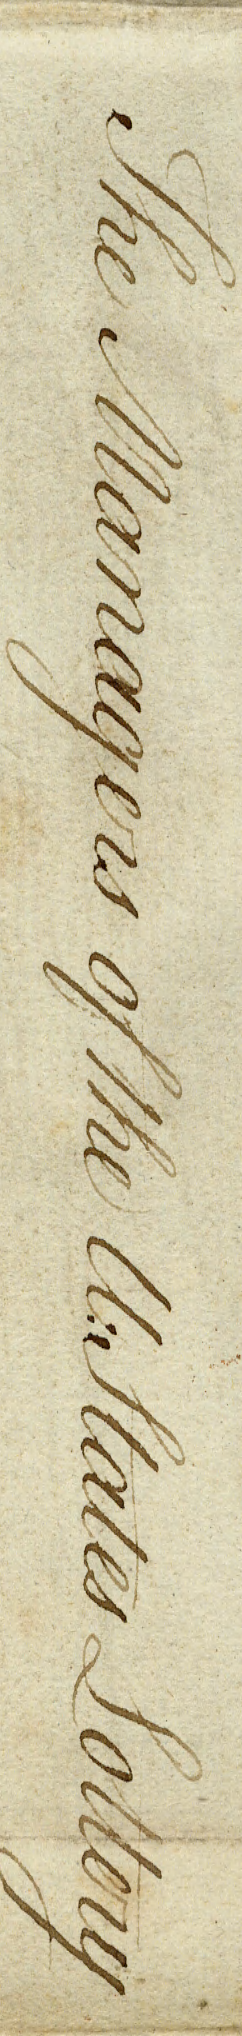The Managers of the U: States Lottery
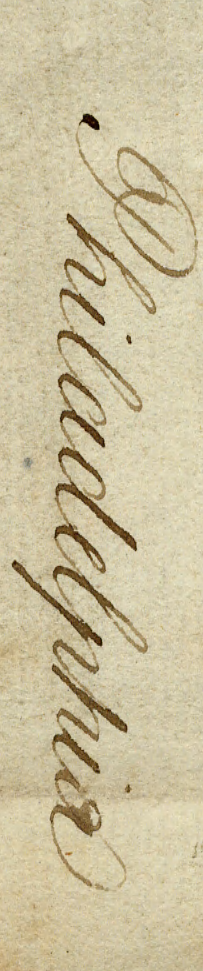Philadelphia
